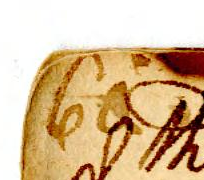60
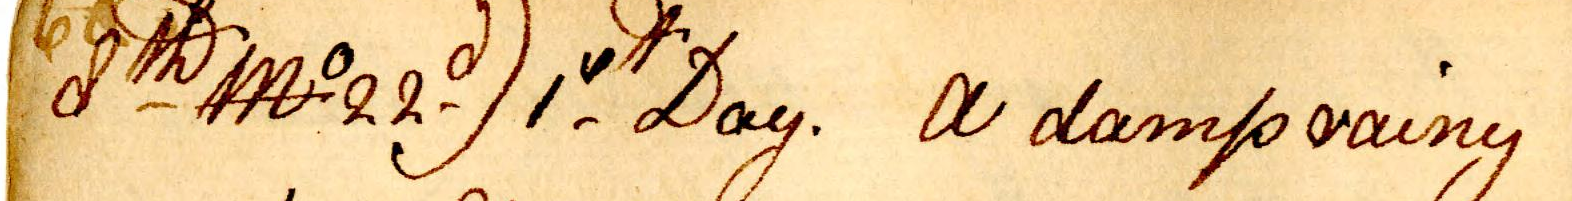8^th M^o 22^d) 1^st Day. A damp rainy
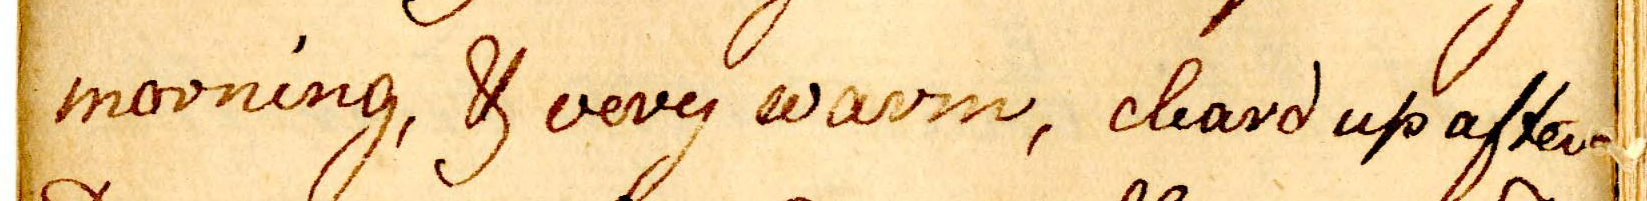morning, & very warm, cleard up after
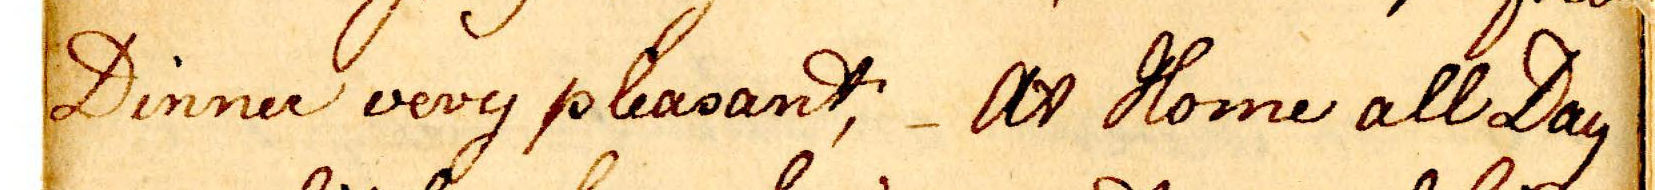Dinner very pleasant, At Home all Day
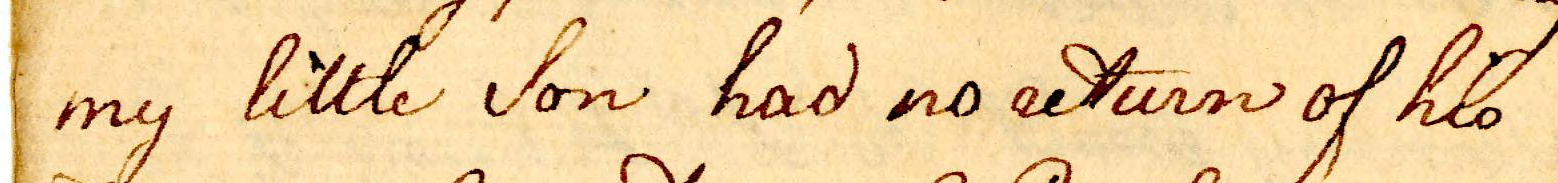my little Son had no return of his
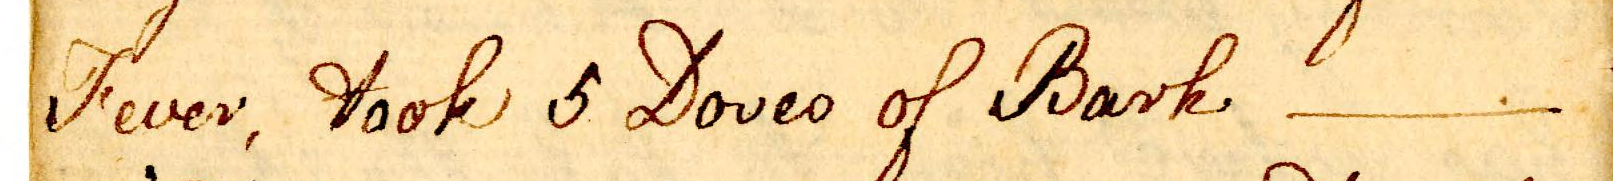Fever, took 5 Doses of Bark
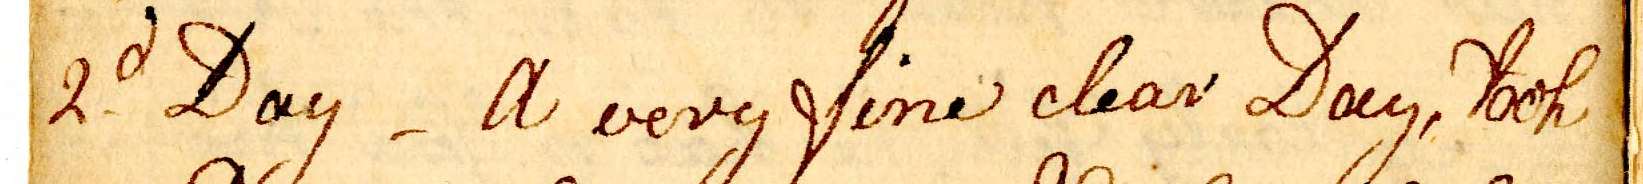2^d Day- A very fine clear Day, took
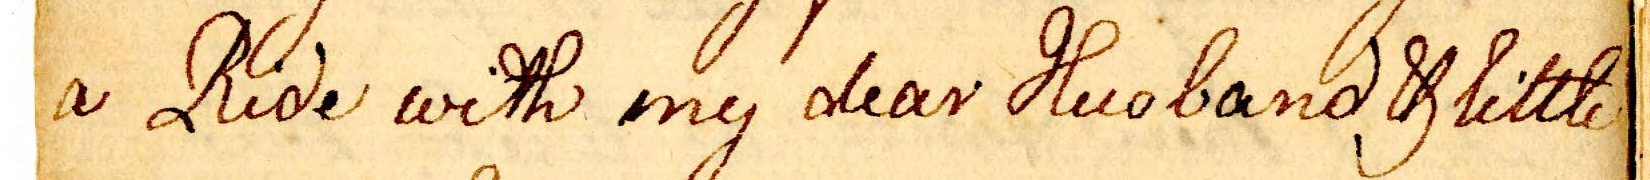a Ride with my dear Husband & little
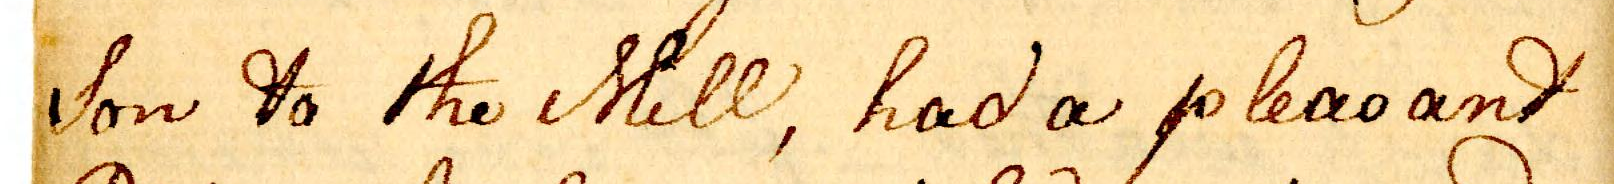Son to the Mill, had a pleasant
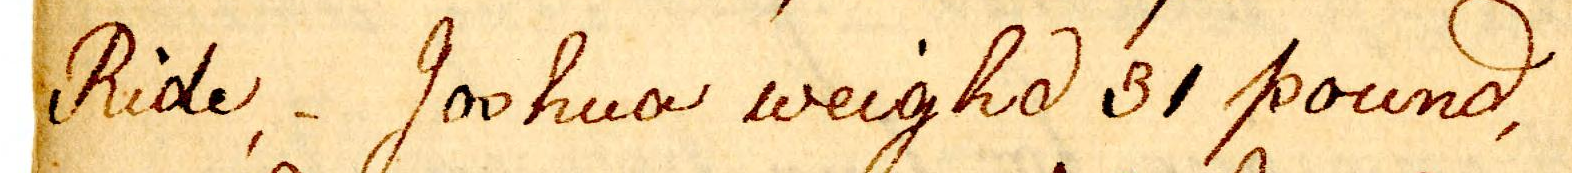Ride,- Joshua weighd 31 pound,
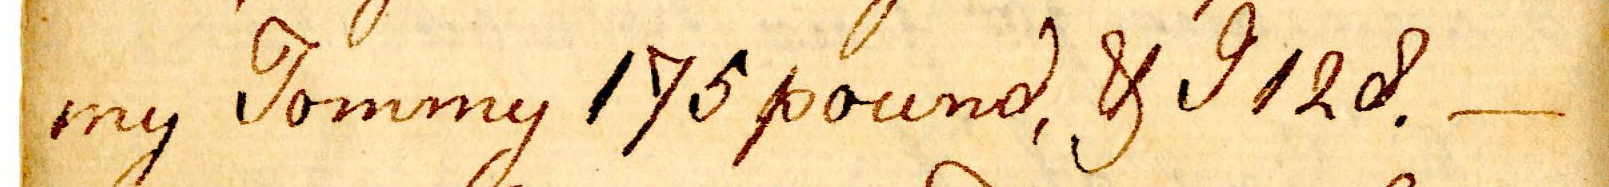my Tommy 175 pound, & I 128.-
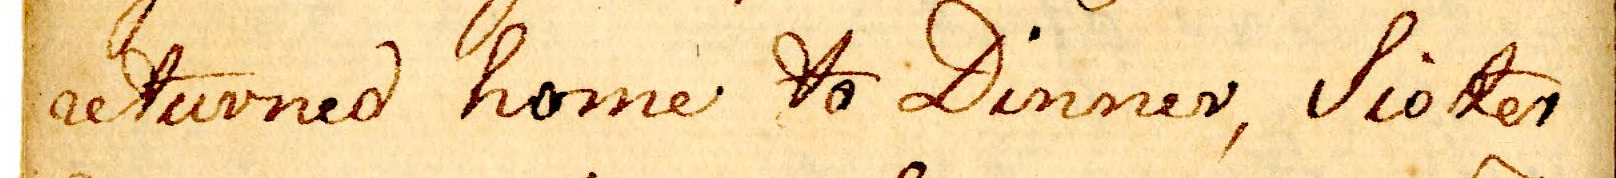returned home to Dinner, Sister
